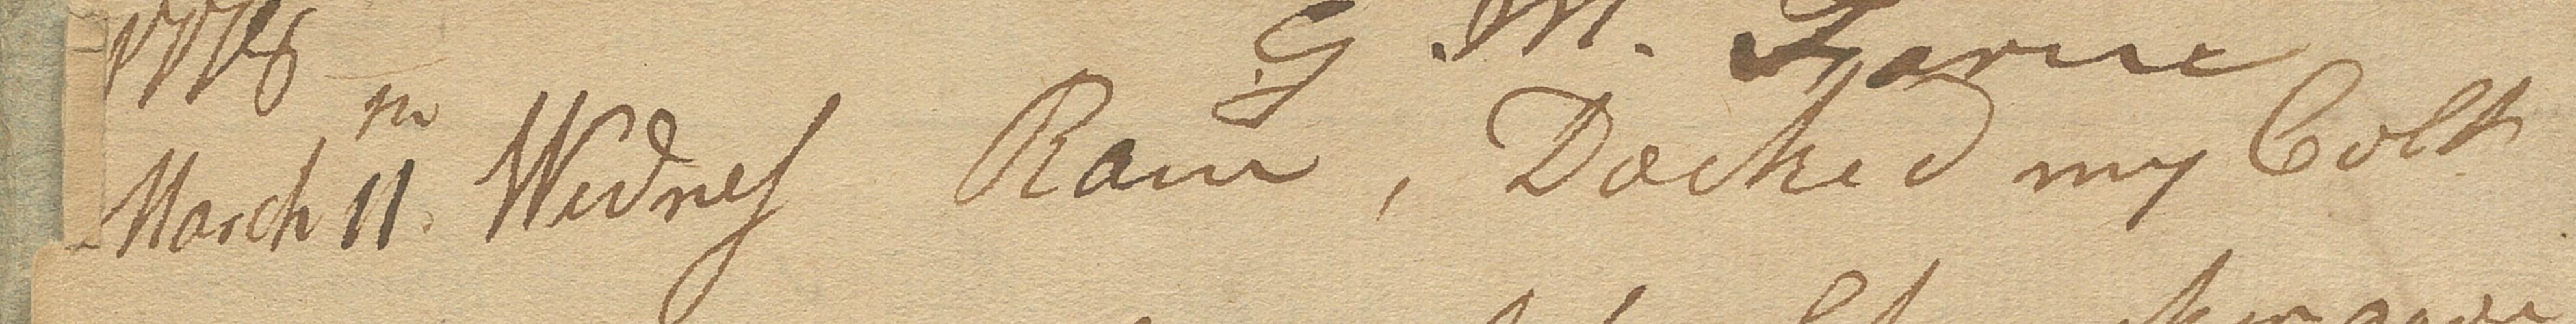March 11 Wednes Rain, Docked my Colt
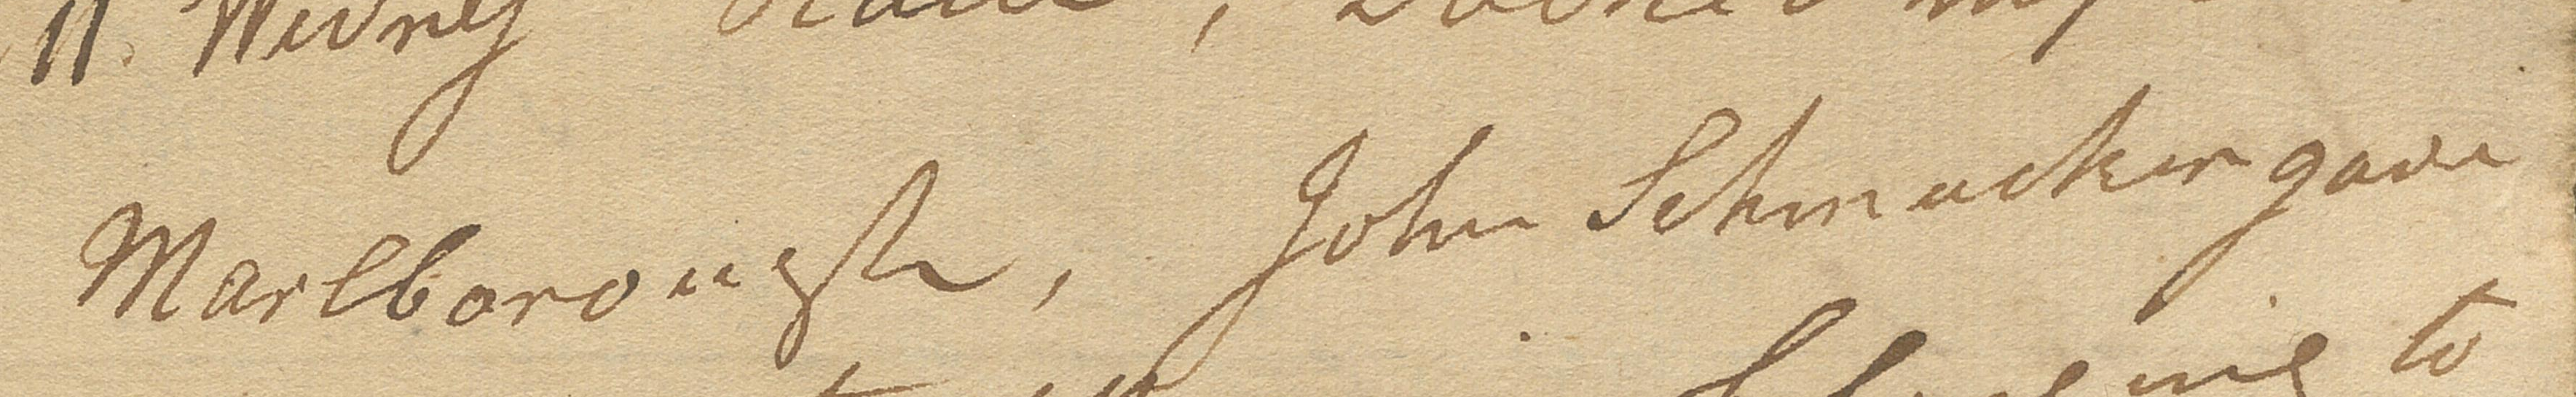Marlborough, John Schmucker gave
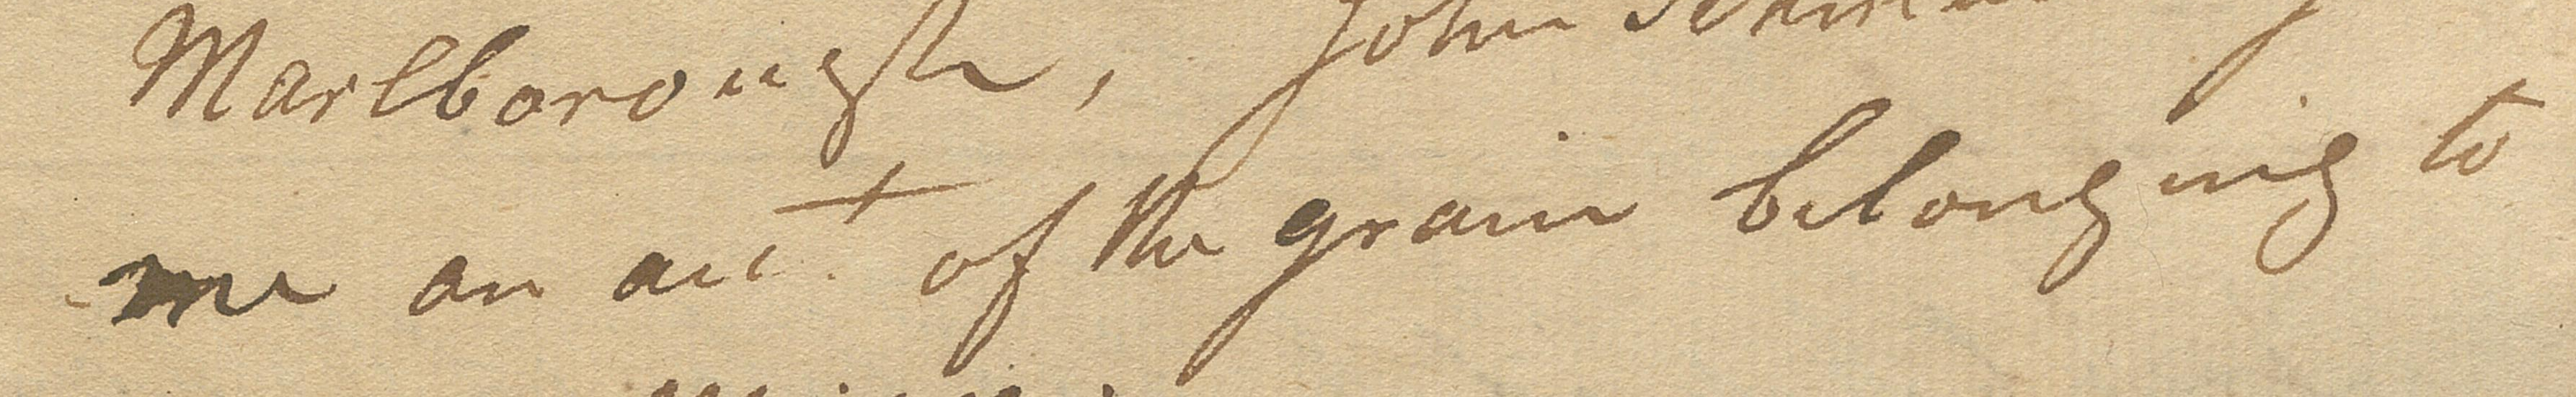me an acc^t. of the grain belonging to
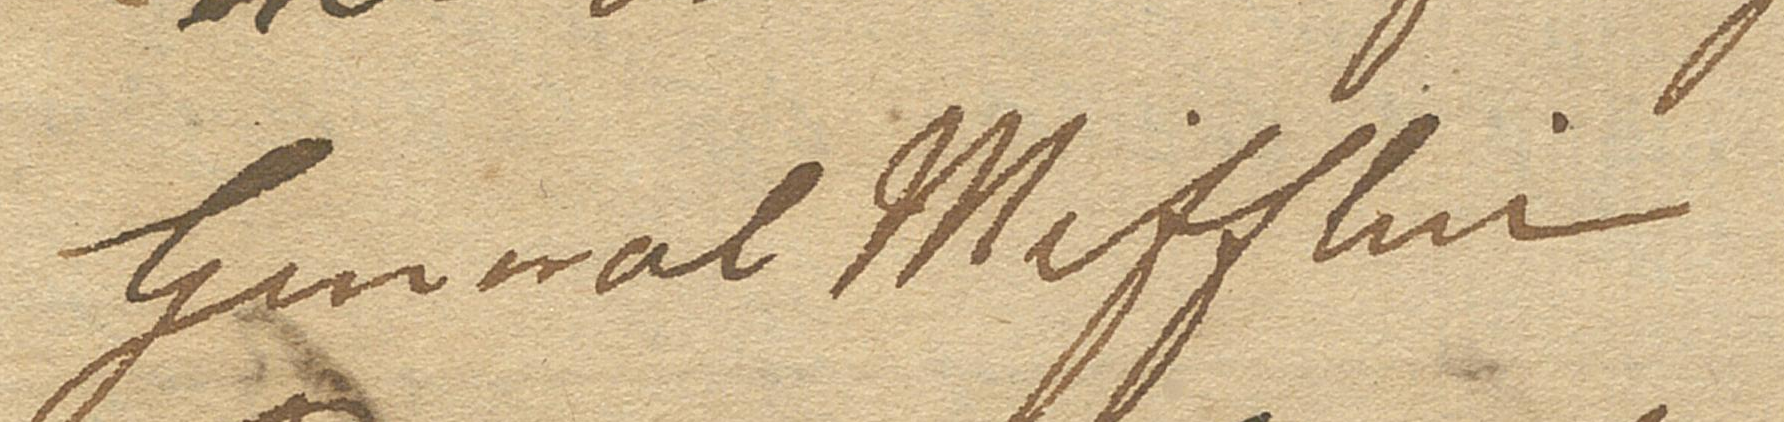General Mifflin
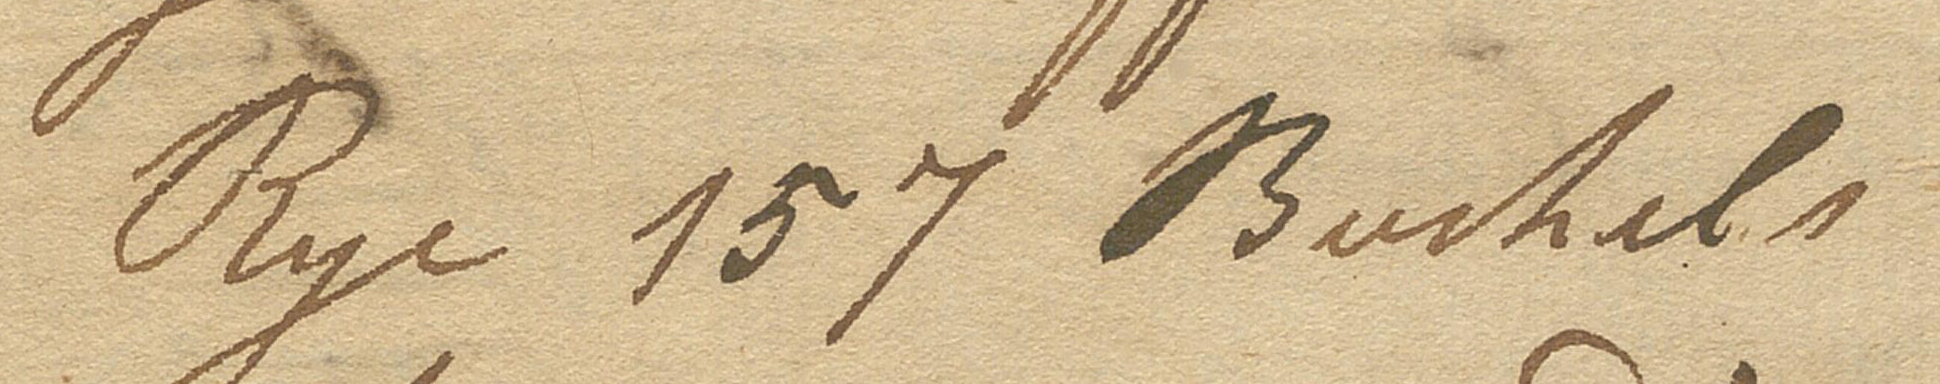Rye 157 Bushels
